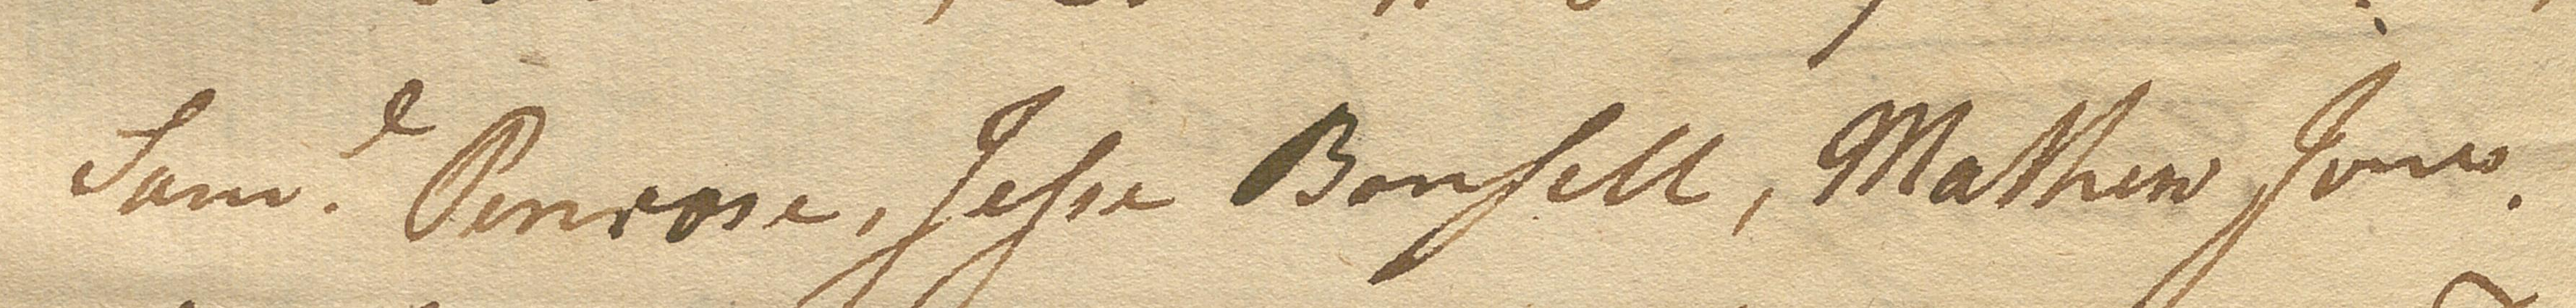Sam^l. Penrose, Jesse Bonsell, Mathew Jones
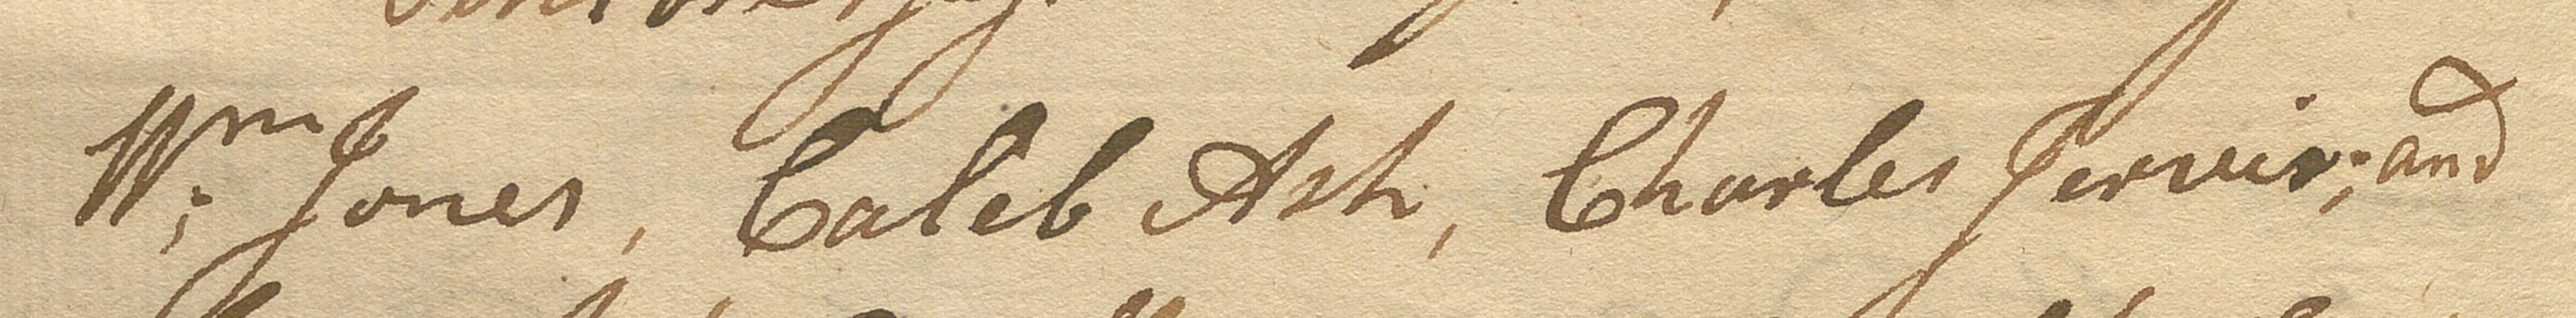W^m. Jones, Caleb Ash, Charles Jervis; and
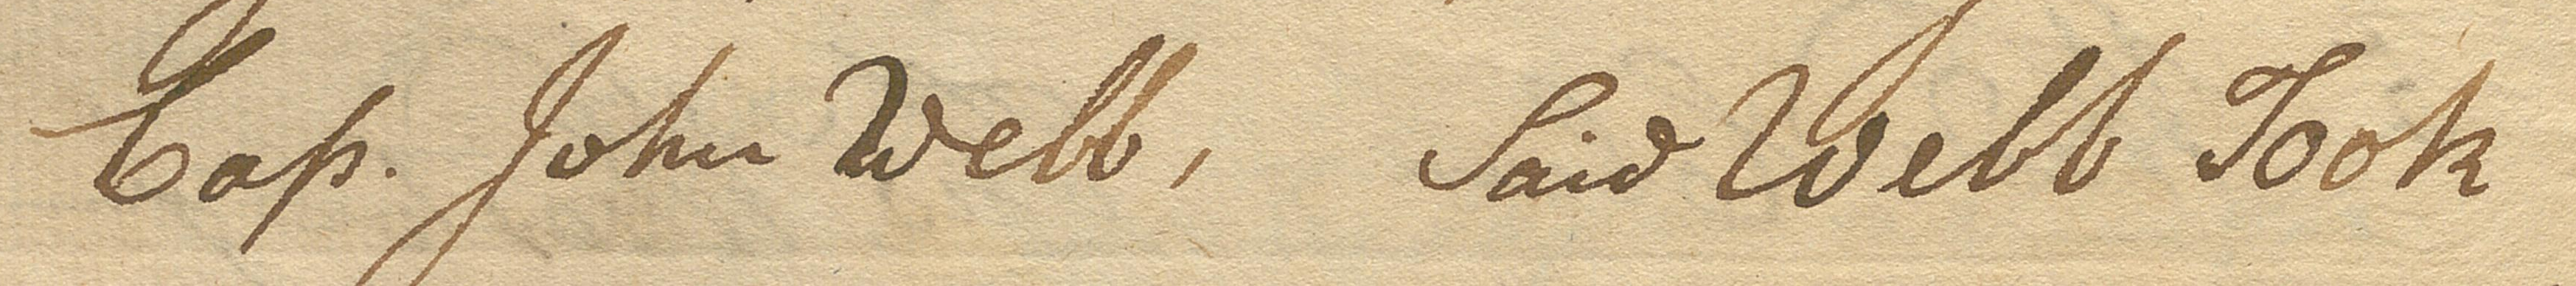Cap. John Webb, Said Webb Took
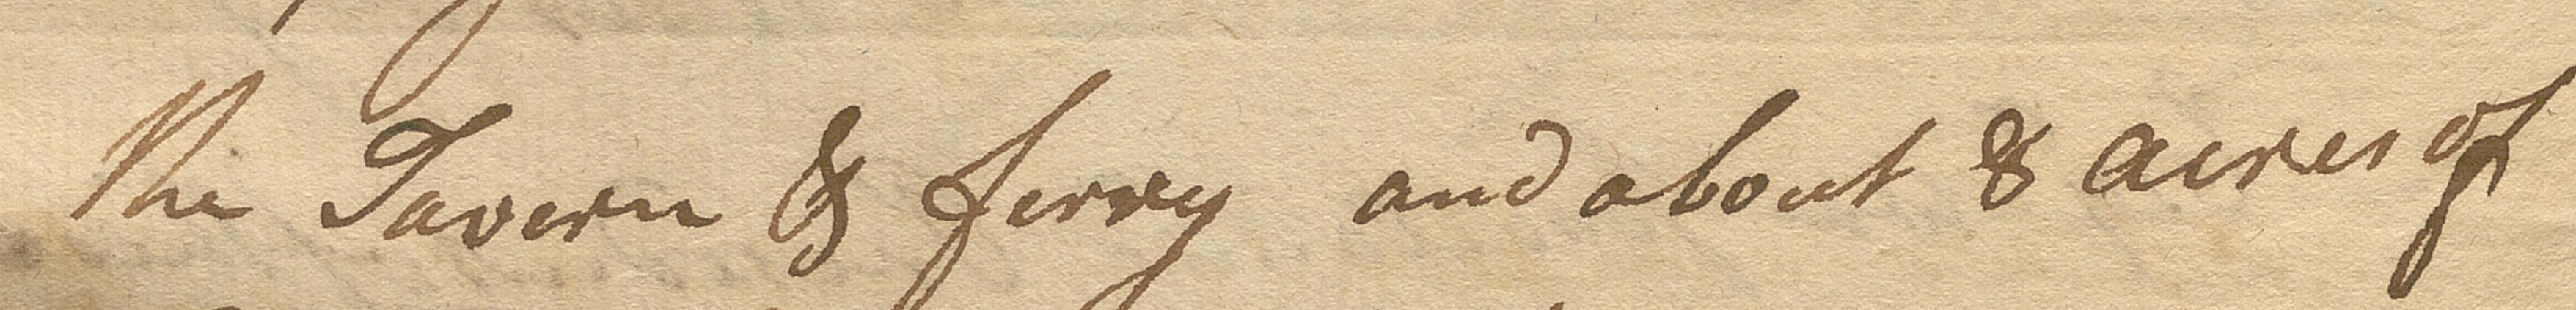The Tavern & ferry and about 8 acres of
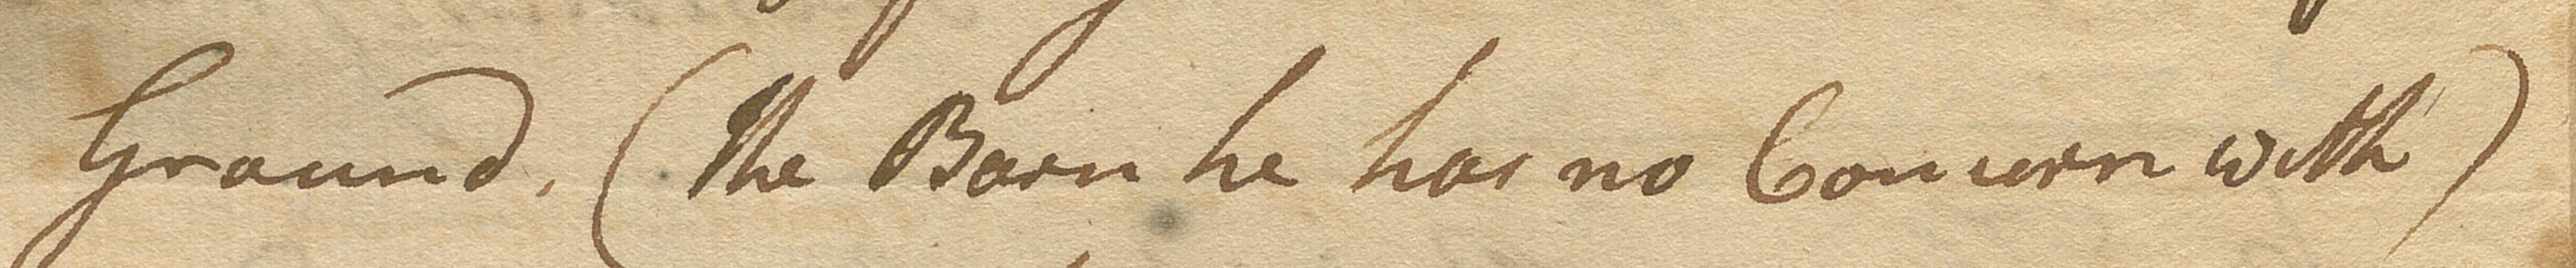Ground. (the Barn he has no Concern with)
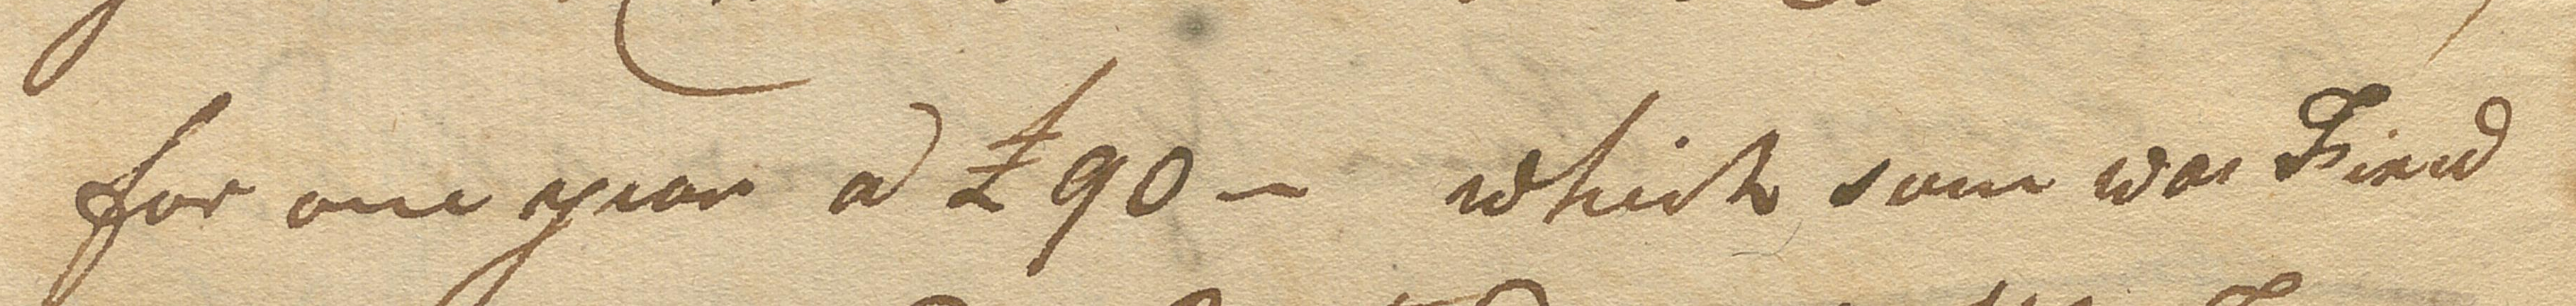for one year @ £90- which sum was Fined
